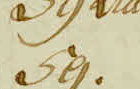59.
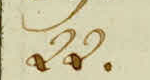22.
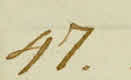47.
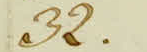32.
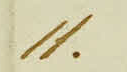11.
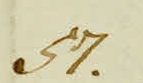57.
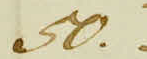50.
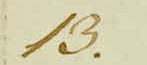13.
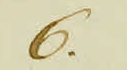6.
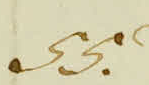55.
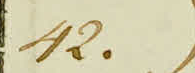42.
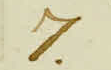7.
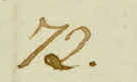72.
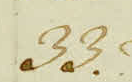33.
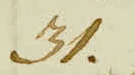31.
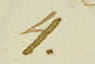4.
